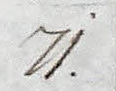71.
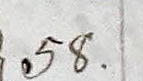58.
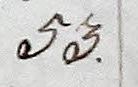53.
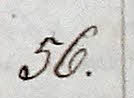56.
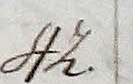42.
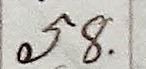58.
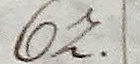62.
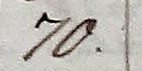70.
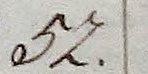52.
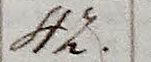42.
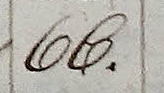66.
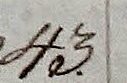43.
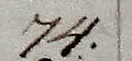74.
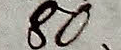80.
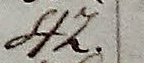42.
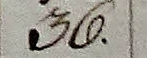36.
